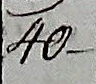40
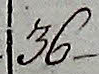36
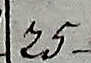25
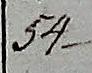54
